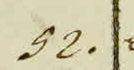52.
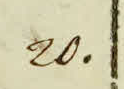20.
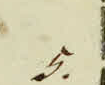5.
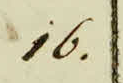16.
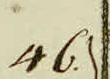46.
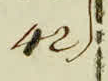42
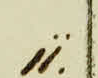11.
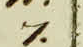7.
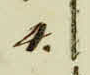4.
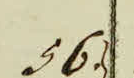56.
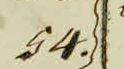54.
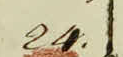24.
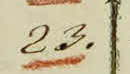23.
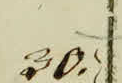30.
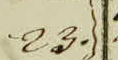23.
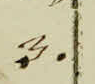3.
